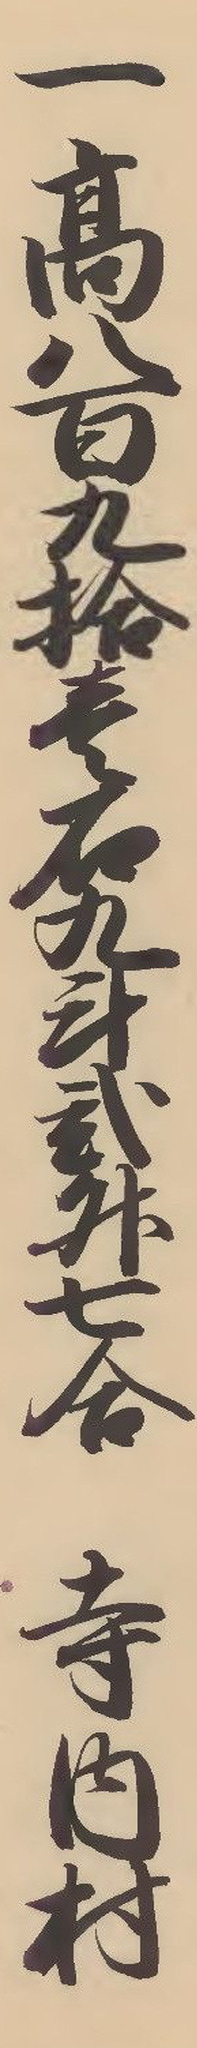一高八百九拾壱石九斗弐升七合寺内村

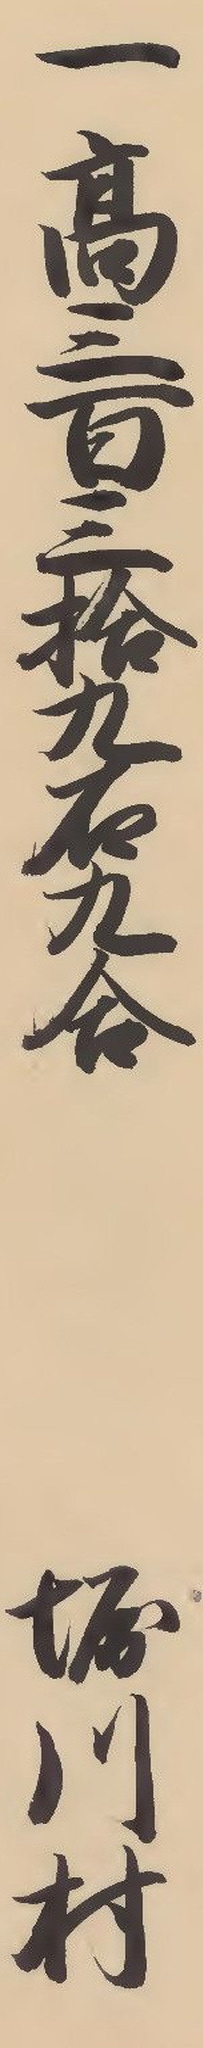一高三百三拾九石九合堀川村
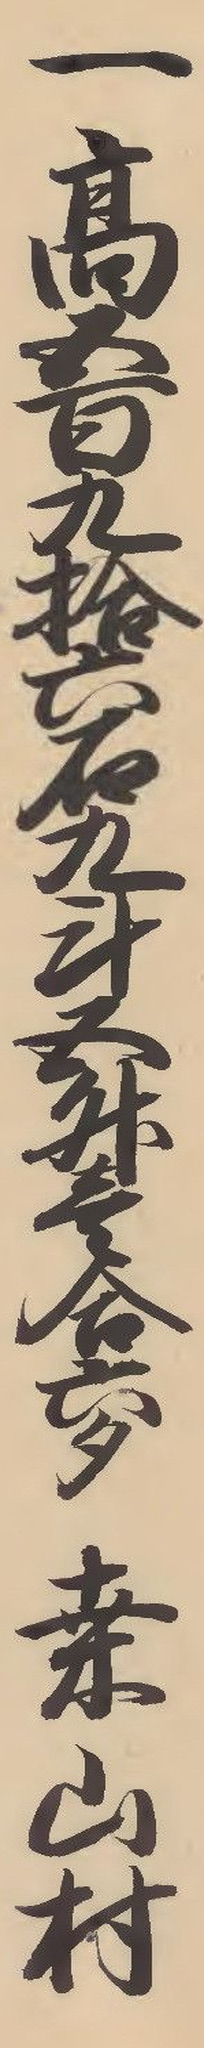一高五百九拾六石九斗五升壱合六勺桑山村
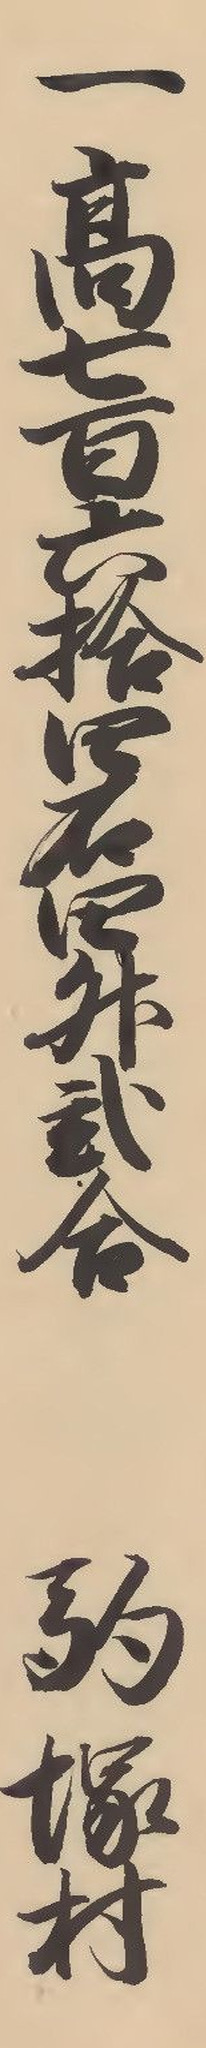一高七百六拾四石四升弐合駒塚村
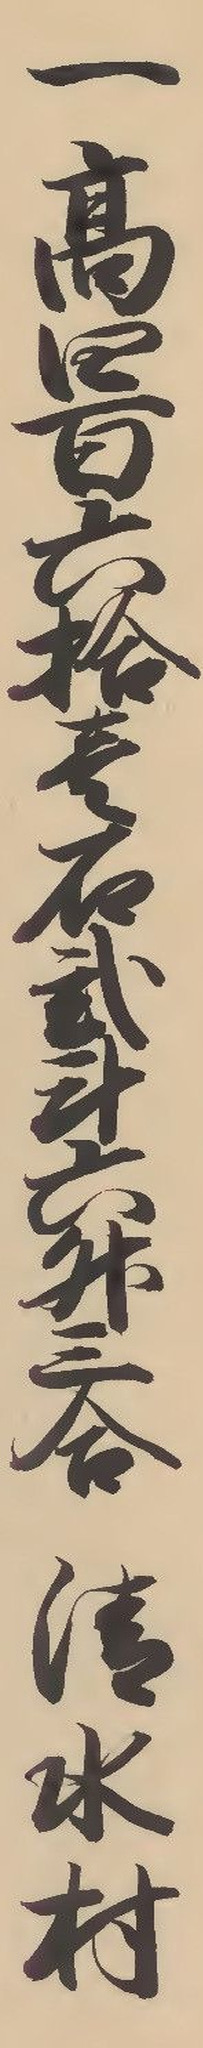一高四百六拾壱石弐斗六升三合清水村
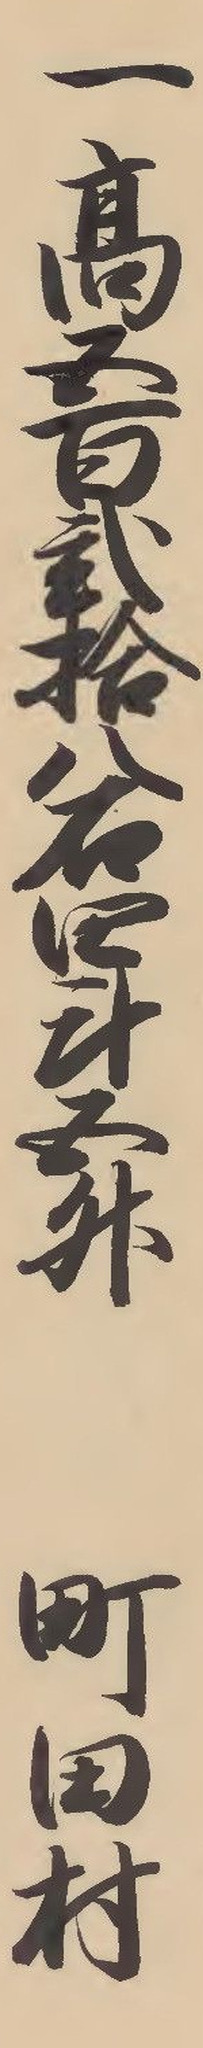一高五百弐拾八石四斗五升町田村
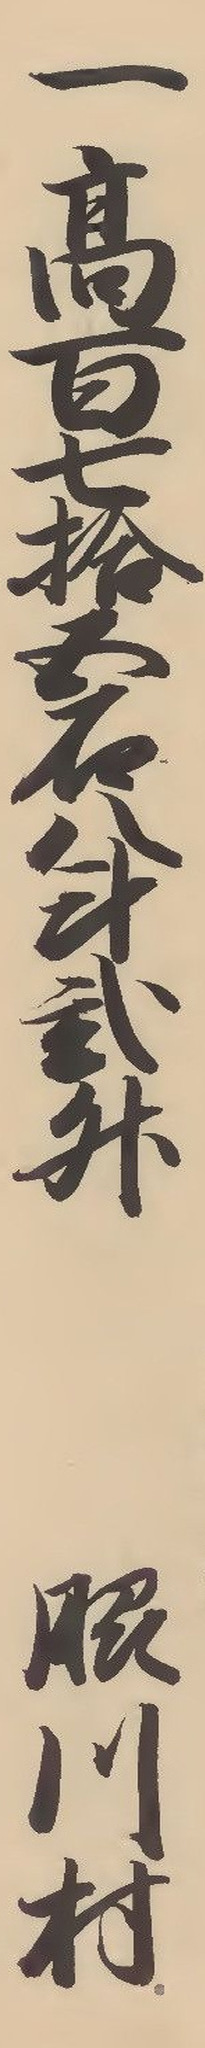一高百七拾五石八斗弐升脇川村
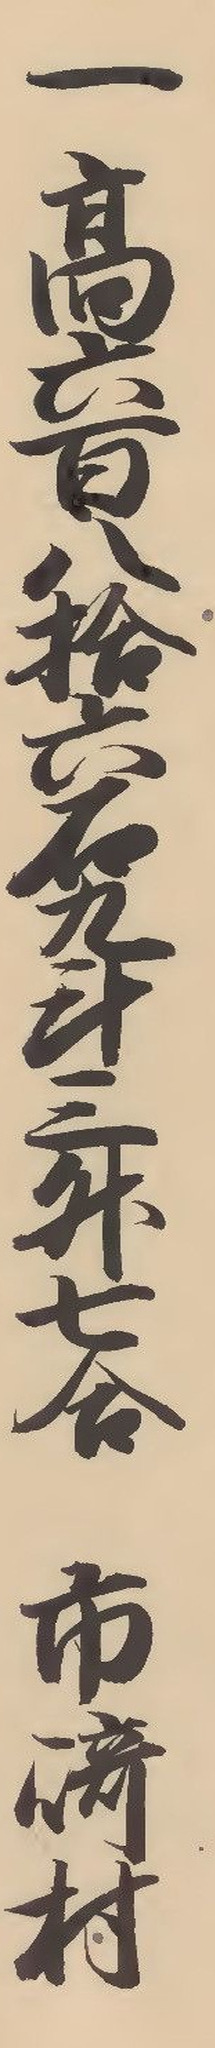一高六百八拾六石九斗三升七合市崎村
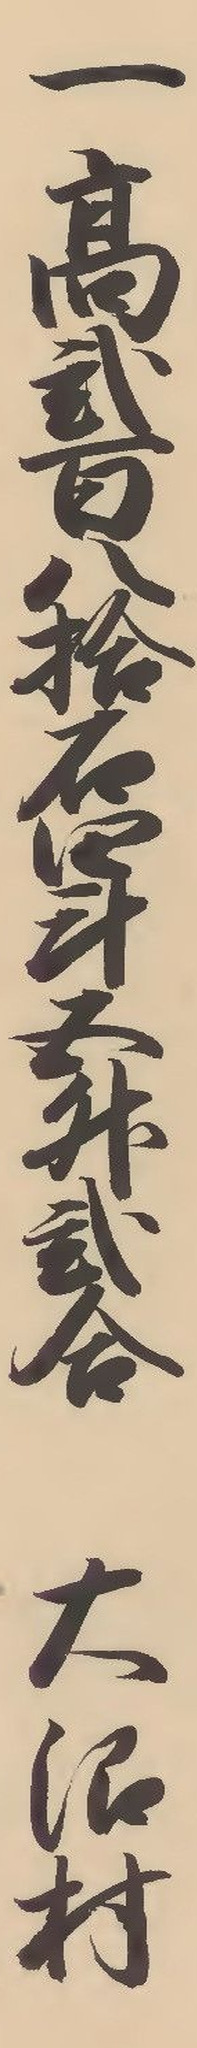一高弐百八拾石四斗五升弐合大沼村

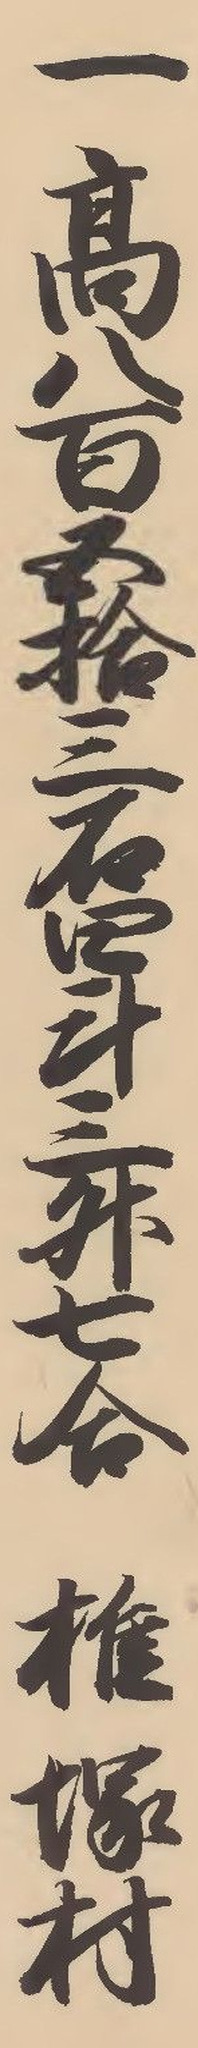一高八百五拾三石四斗三升七合椎塚村
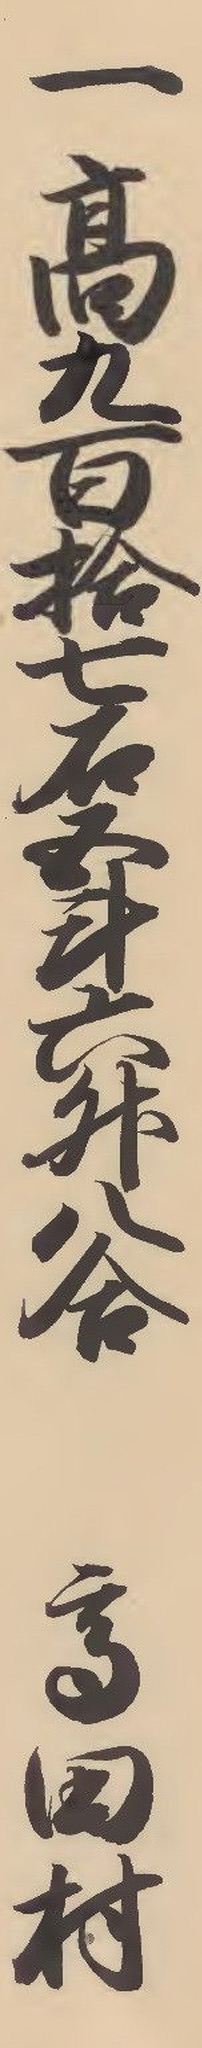一高九百拾七石五斗六升八合高田村
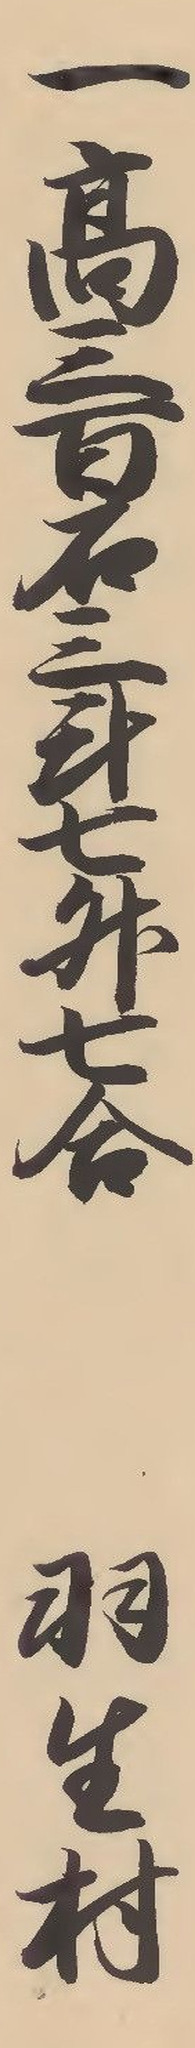一高三百石三斗七升七合羽生村
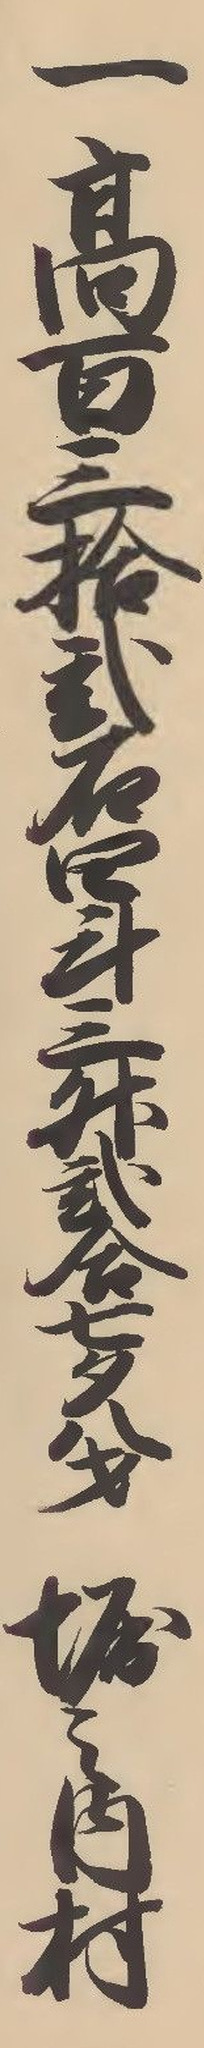一高百三拾弐石四斗三升弐合七勺八才堀之内村
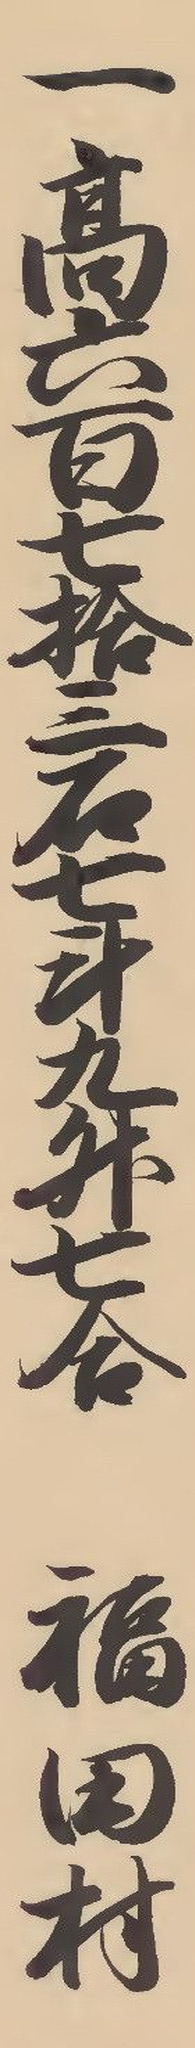一高六百七拾三石七斗九升七合福田村
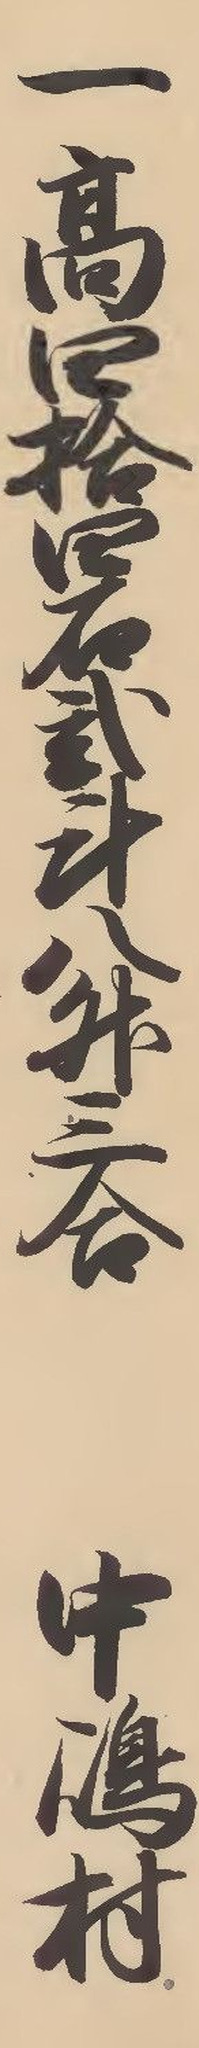一高四拾四石弐斗八升三合中島村
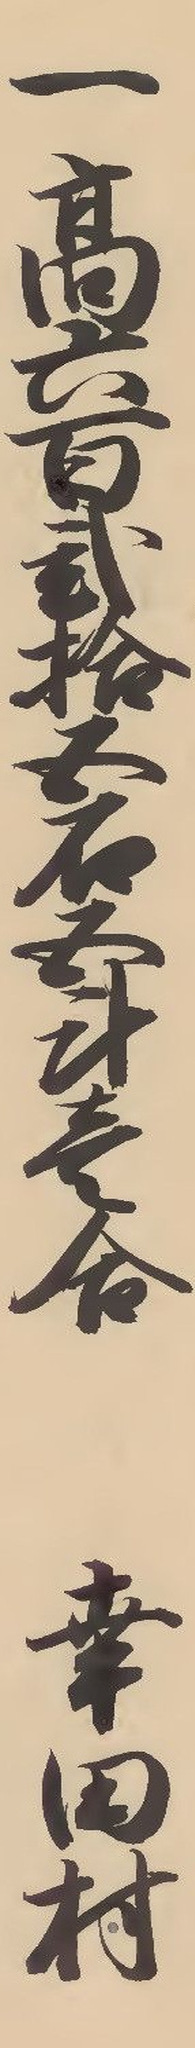一高六百弐拾五石五斗壱合幸田村
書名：常陸国郷帳
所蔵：国立公文書館 National Archives of Japan
